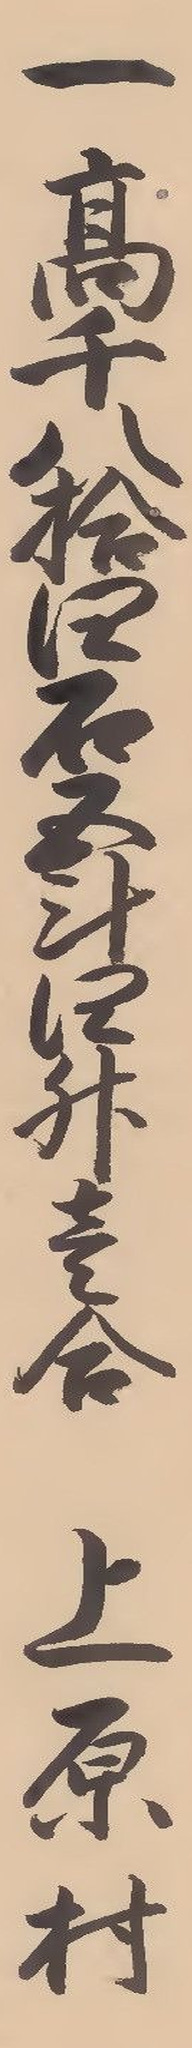一高千八拾四石五斗四升壱合上原村
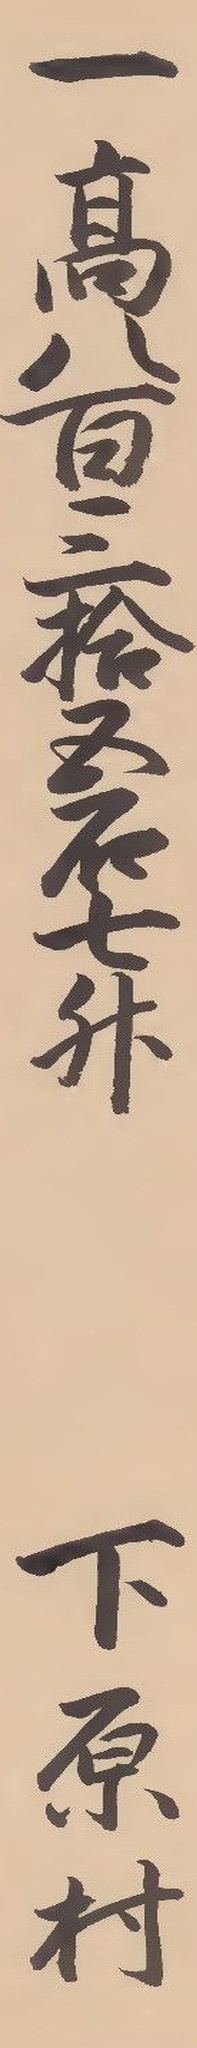一高八百三拾五石七升下原村
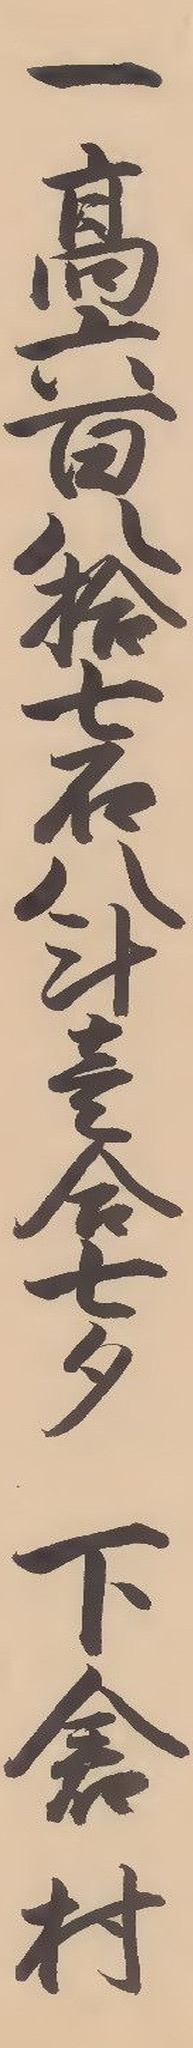一高六百八拾七石八斗壱合七勺下倉村
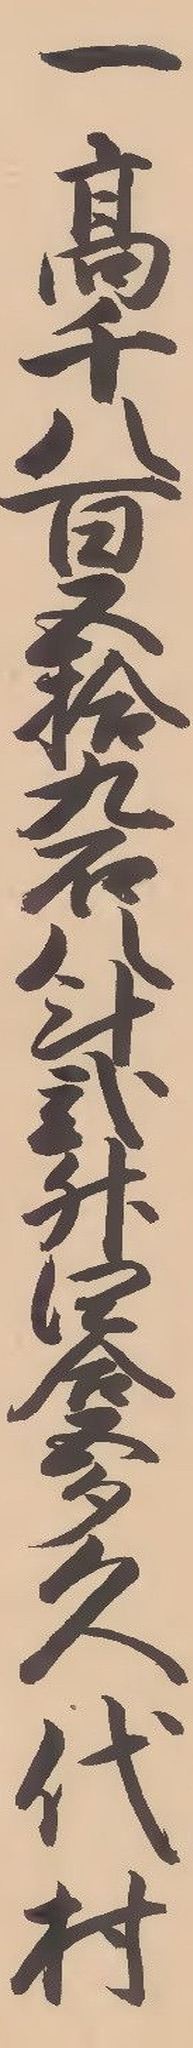一高千八百五拾九石八斗弐升四合五勺久代村
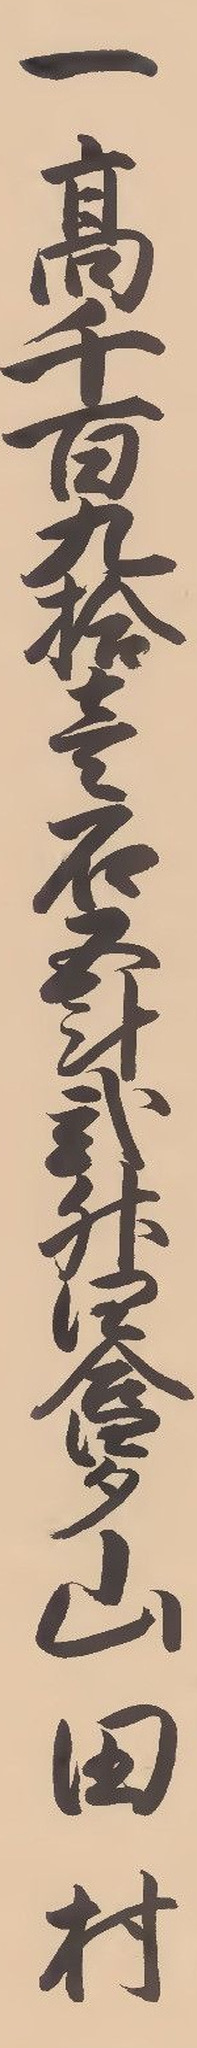一高千百九拾壱石五斗弐升四合四勺山田村
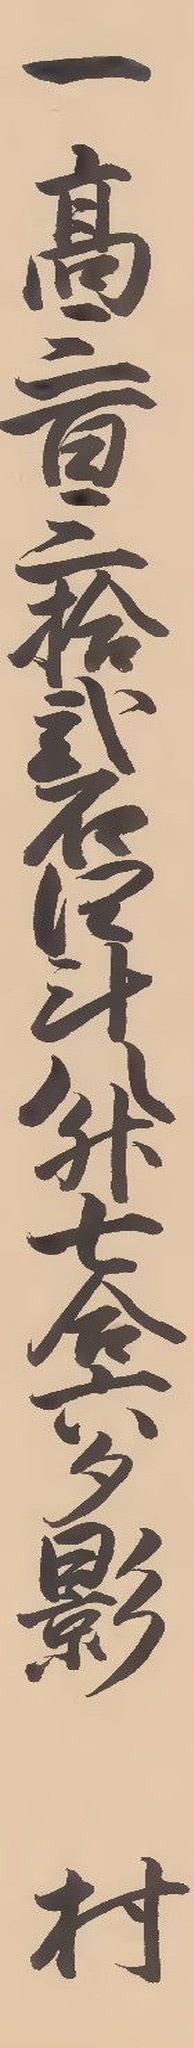一高三百三拾弐石四斗八升七合六勺影村
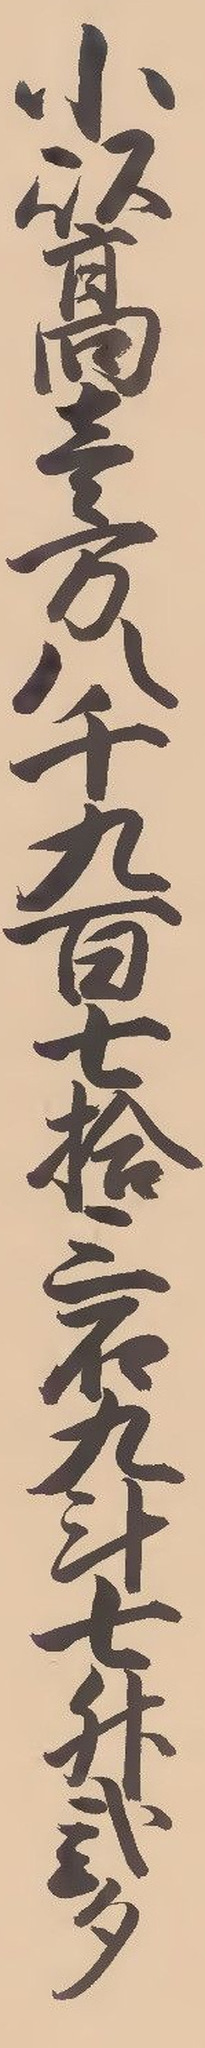小以高壱万八千九百七拾三石九斗七升弐勺

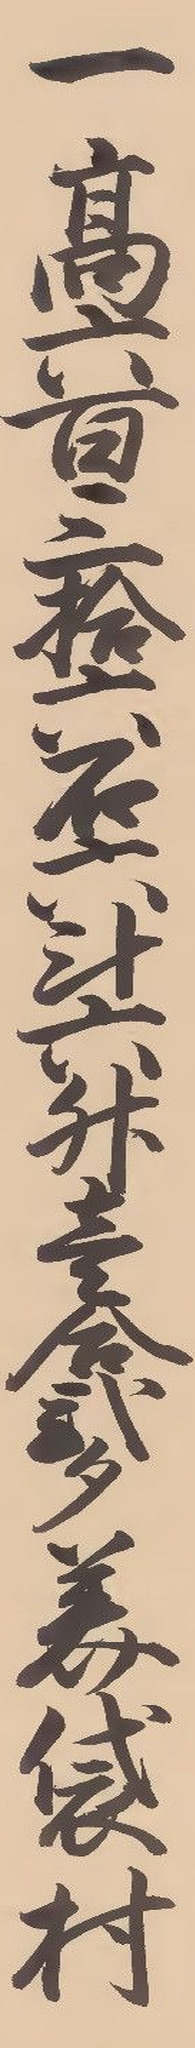一高六百三拾六石六斗六升壱合弐勺美袋村
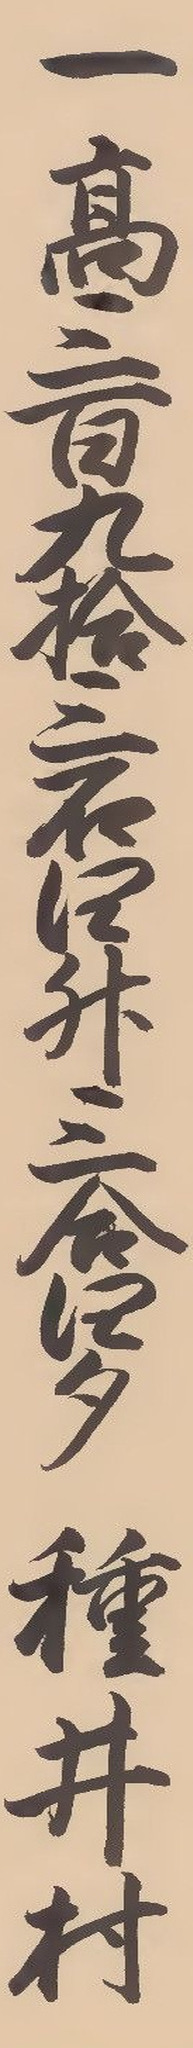一高三百九拾三石四升三合四勺種井村
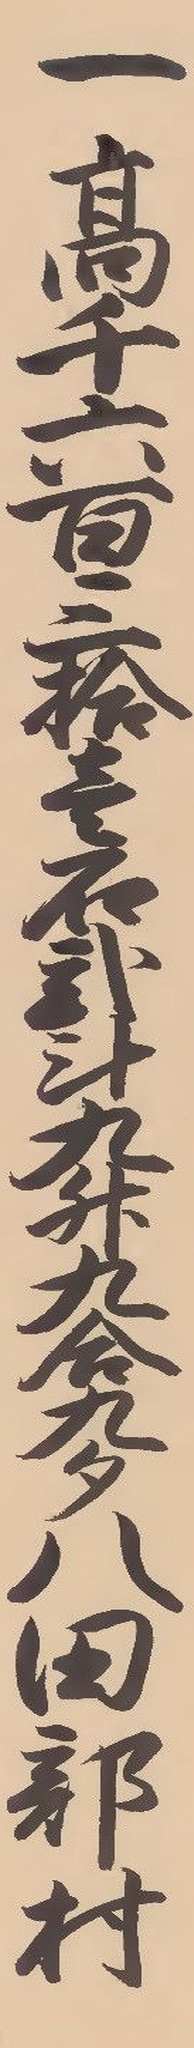一高千六百三拾壱石弐斗九升九合九勺八田部村
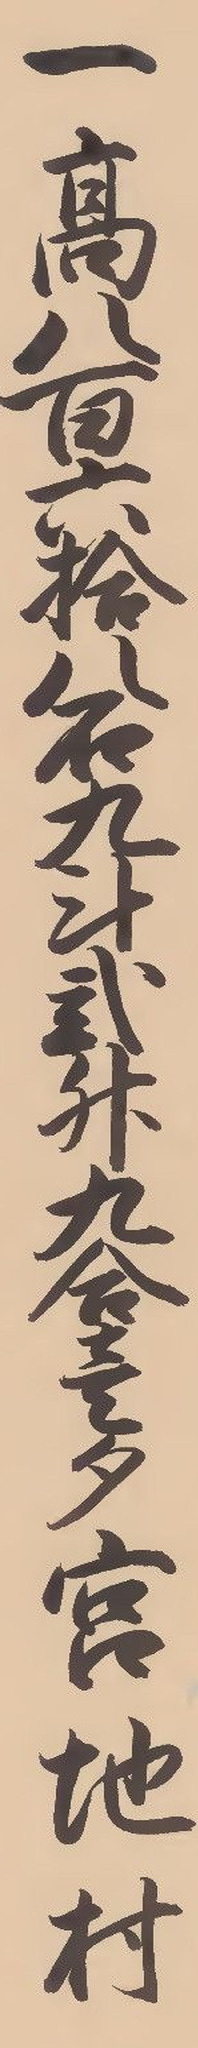一高八百六拾八石九斗弐升九合壱勺宮地村
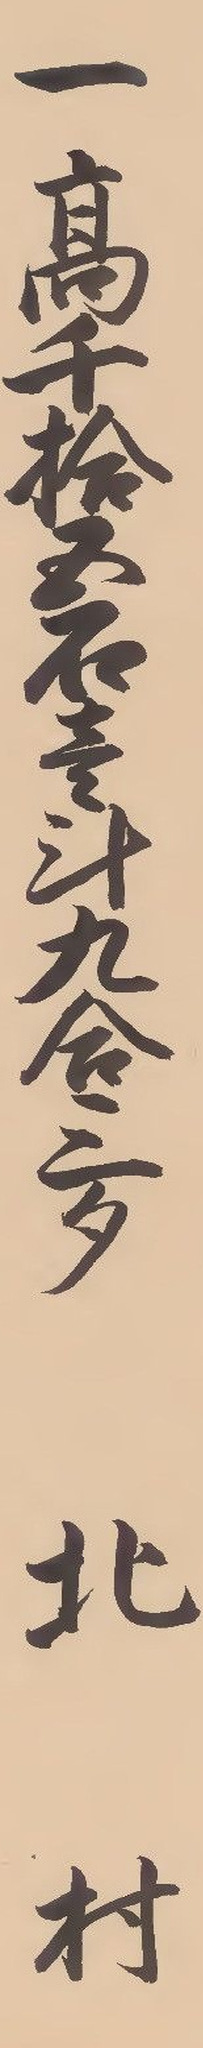一高千拾五石壱斗九合三勺北村
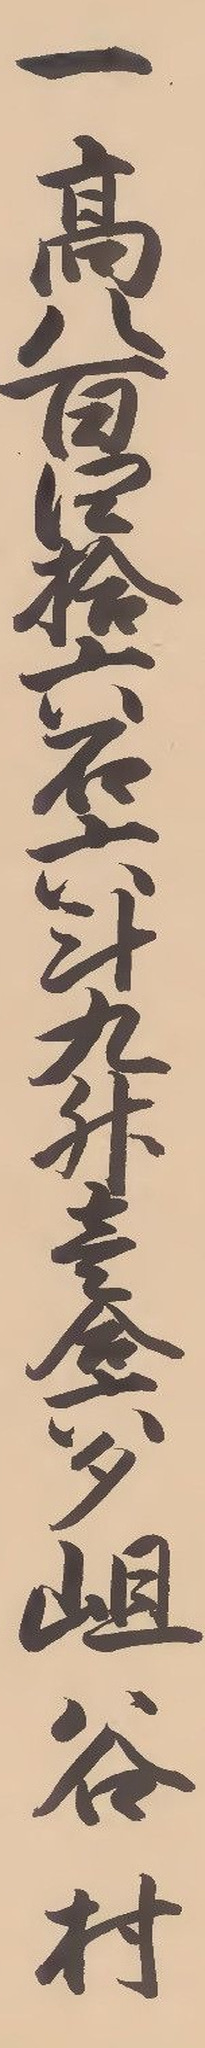一高八百四拾六石六斗九升壱合六勺岨谷村
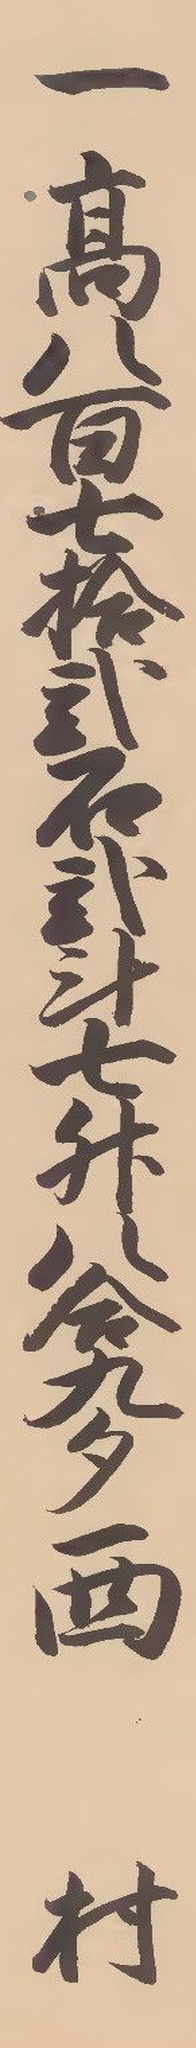一高八百七拾弐石弐斗七升八合九勺西村

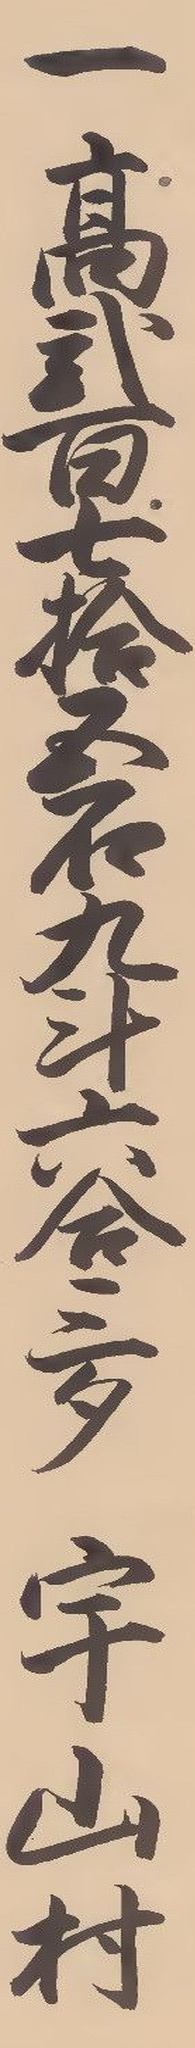一高弐百七拾五石九斗六合三勺宇山村
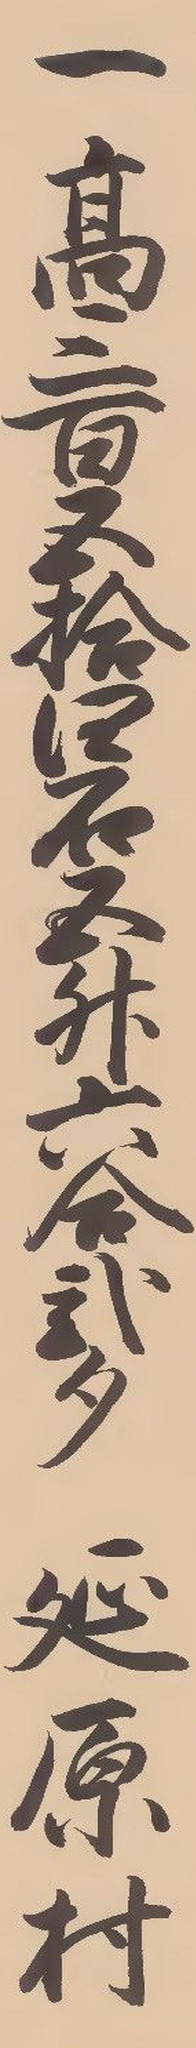一高三百五拾四石五升六合弐勺延原村
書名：備中国郷帳
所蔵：国立公文書館 National Archives of Japan
